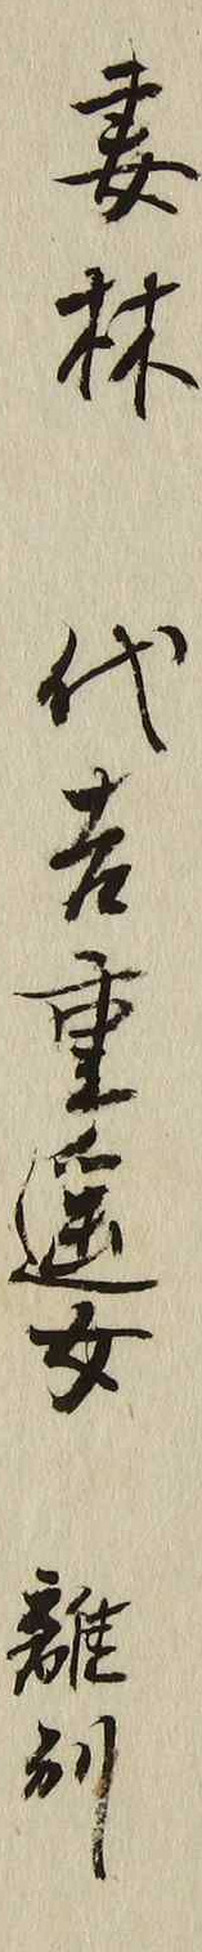妻林代吉重遥女離別
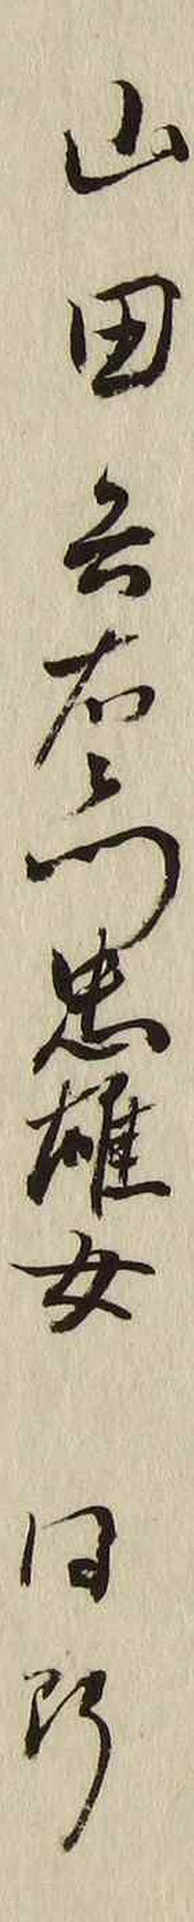山田兵右候門忠雄女同断
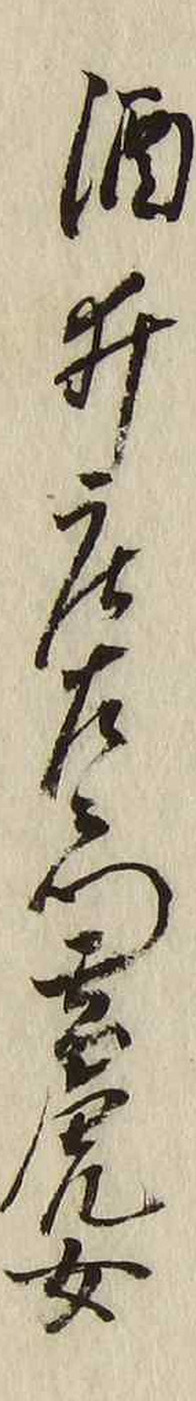酒井庄左衛門玄虎女

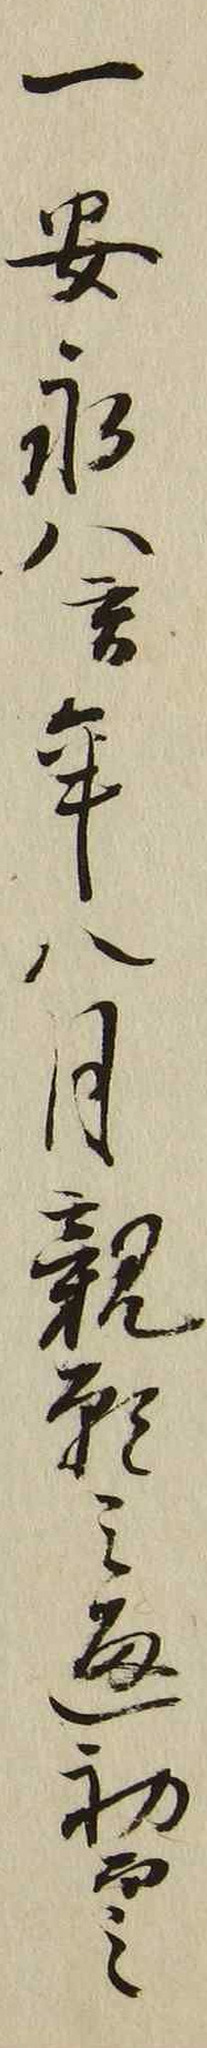一安永八亥年八月親願之通初而之
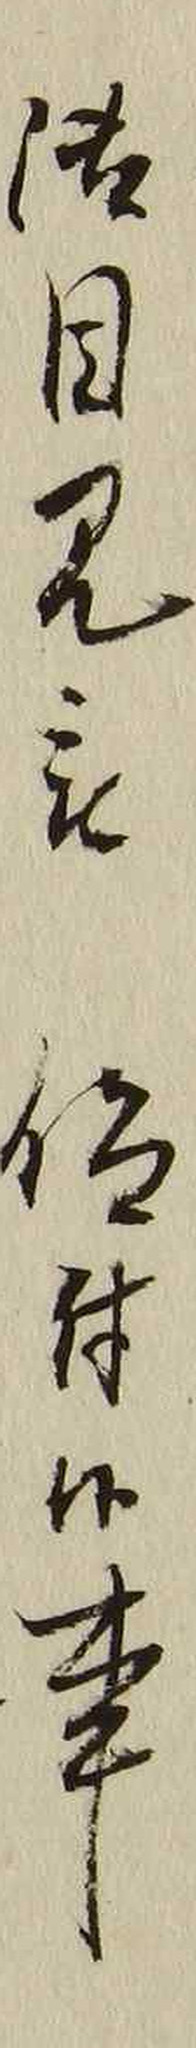御目見被仰付候事
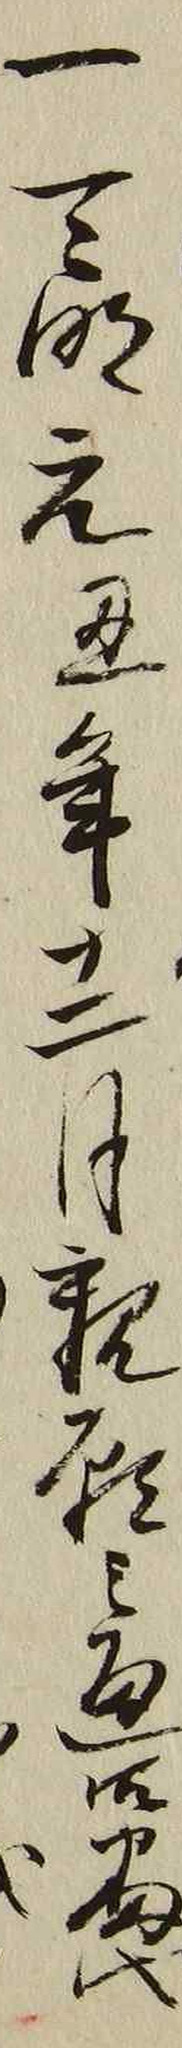一天明元丑年十二月親願之通御番代
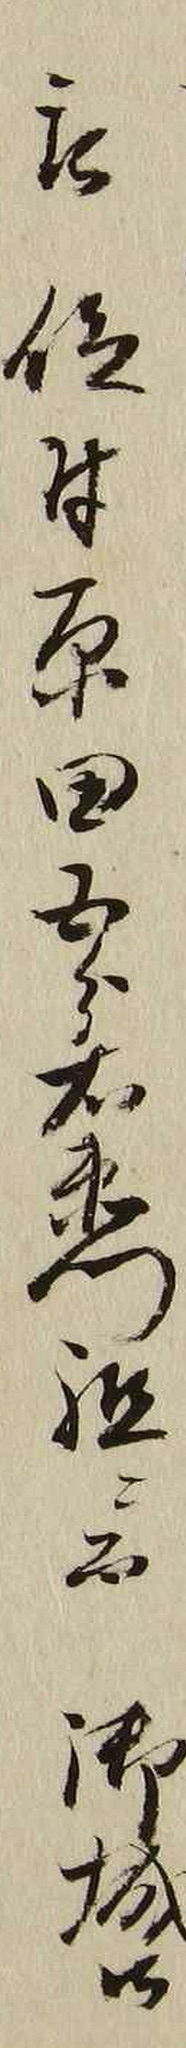被仰付原田五郎右衛門組ニ而御城御
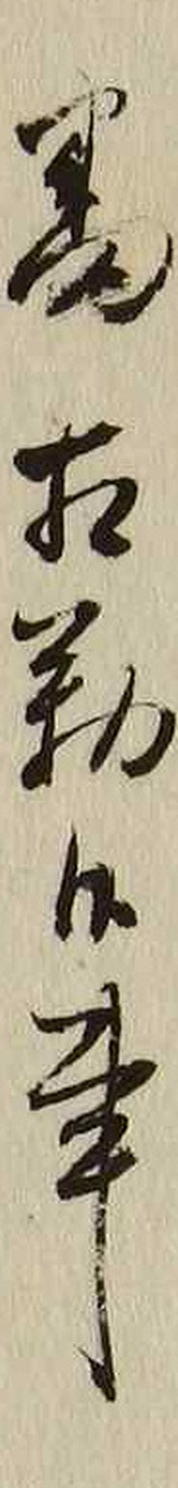番相勤候事
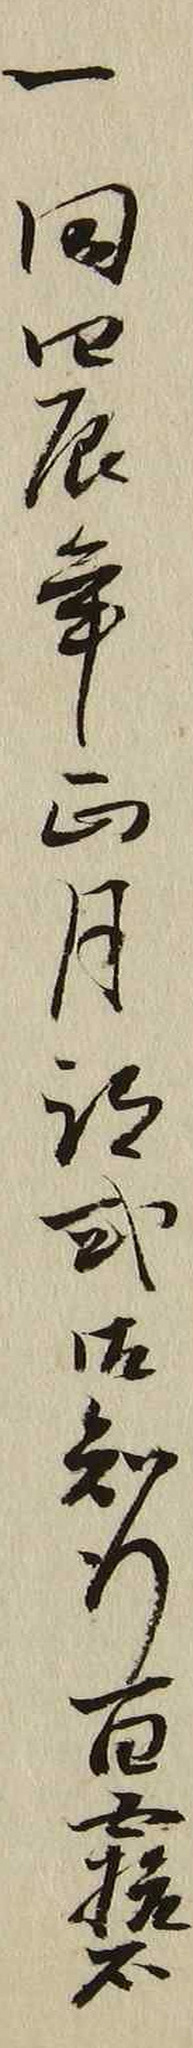一同四辰年正月跡式御知行百五拾石
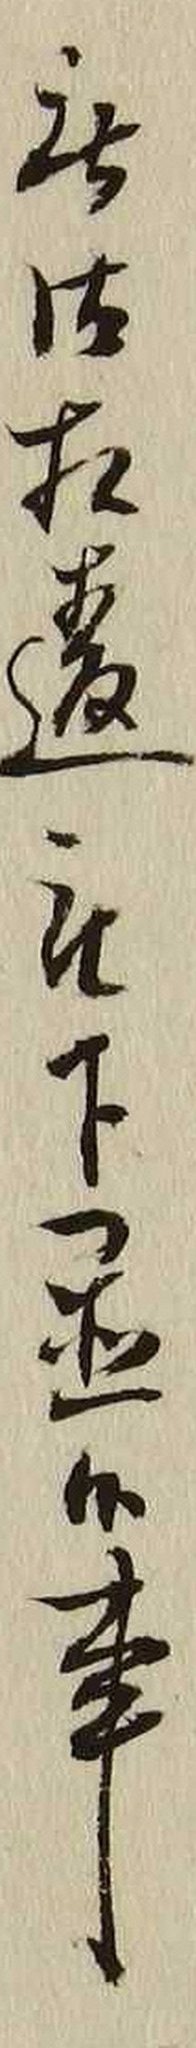無御相違被下置候事
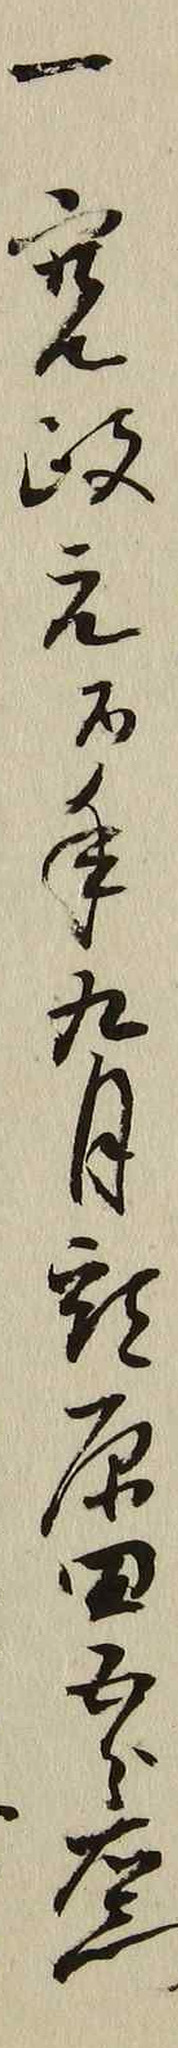一寛政元酉年九月頭原田五郎右衛門
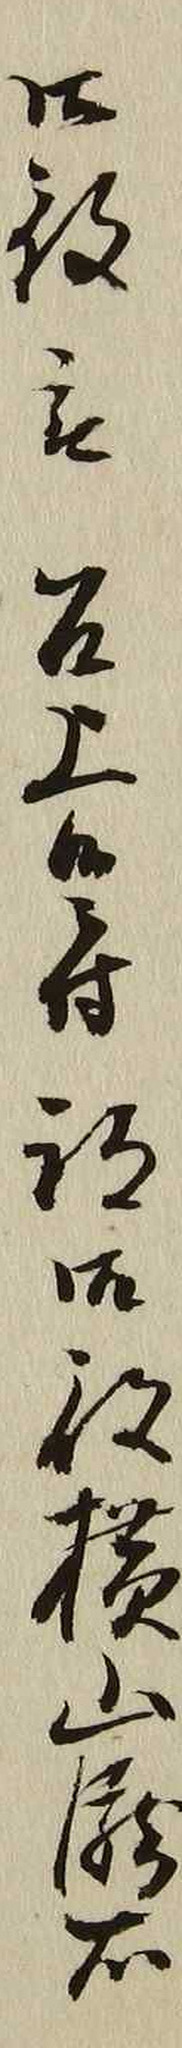御役被召上候ニ付跡御役横山瀧右
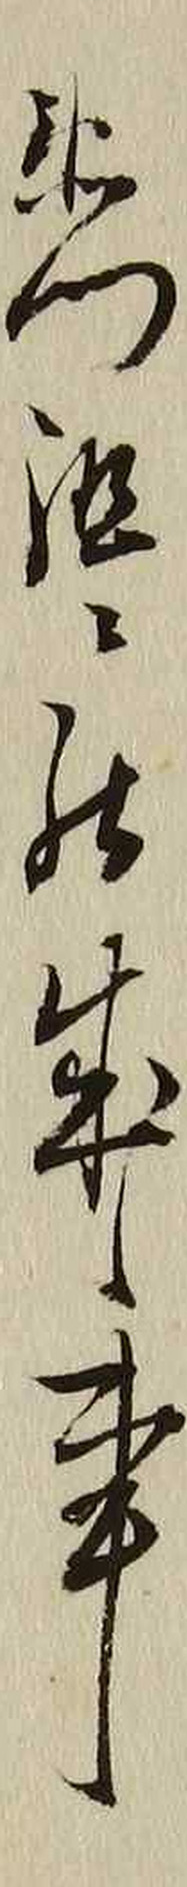衛門組ニ罷成候事
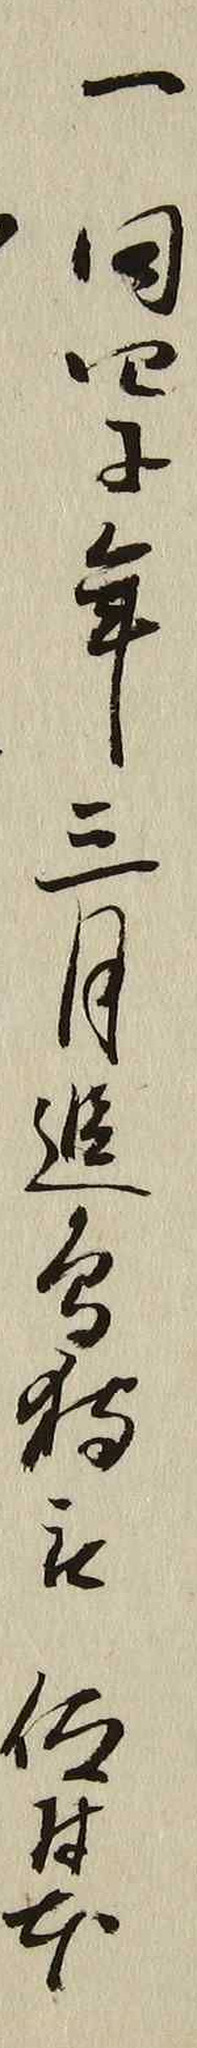一同四子年三月追鳥狩被仰付本
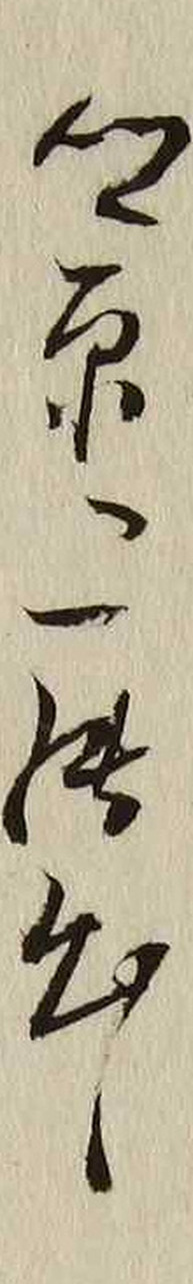郷原へ罷出候
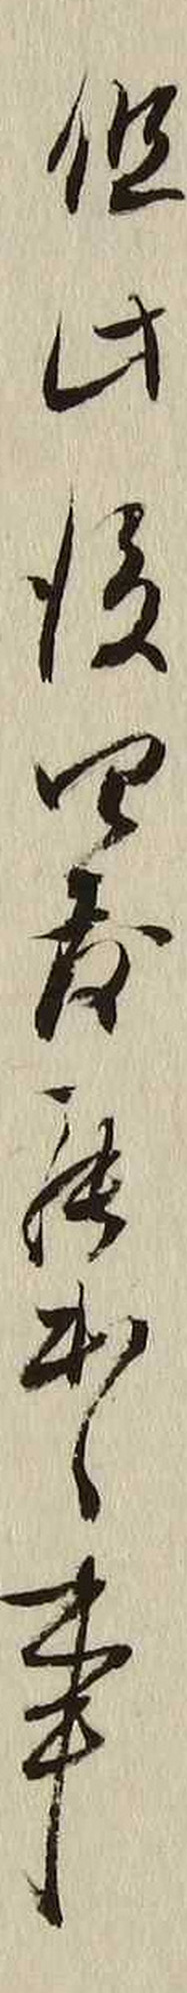但此後四度罷出候事
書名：諸士系譜　巻之348　も之部4
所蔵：会津若松市立会津図書館
